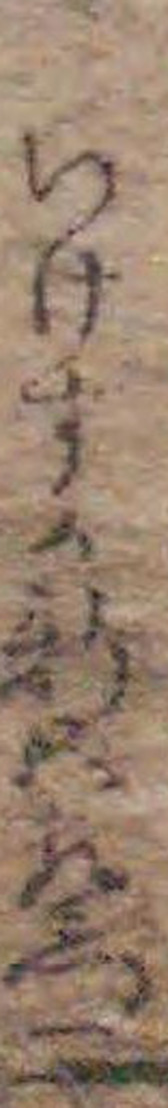いけすか新五左衛門
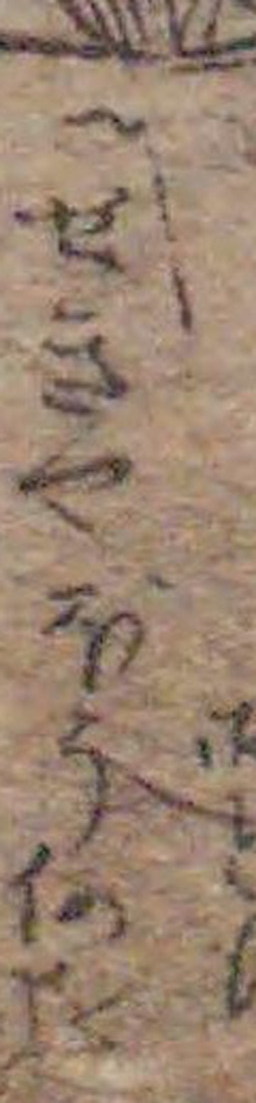〽せきやぼう何を
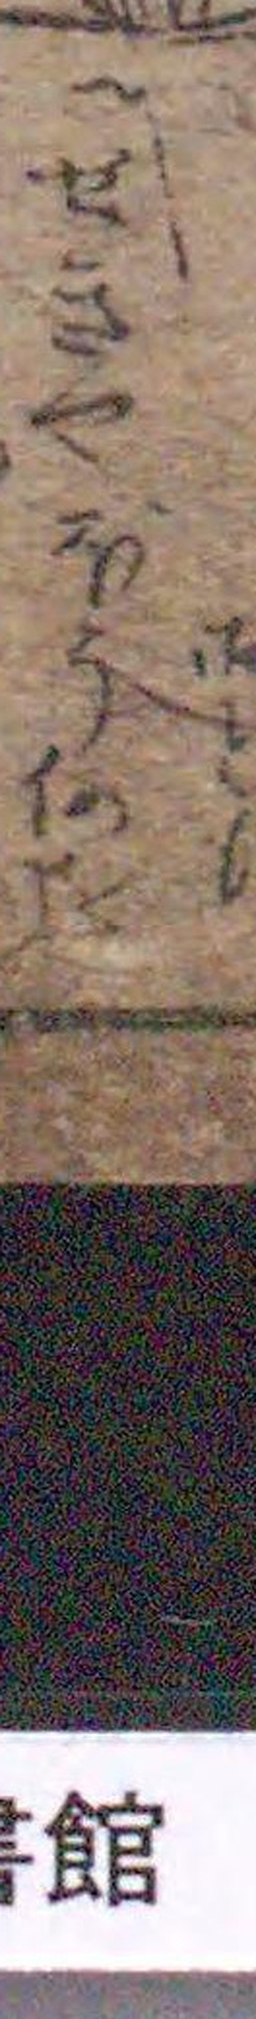〽せきやぼう何を
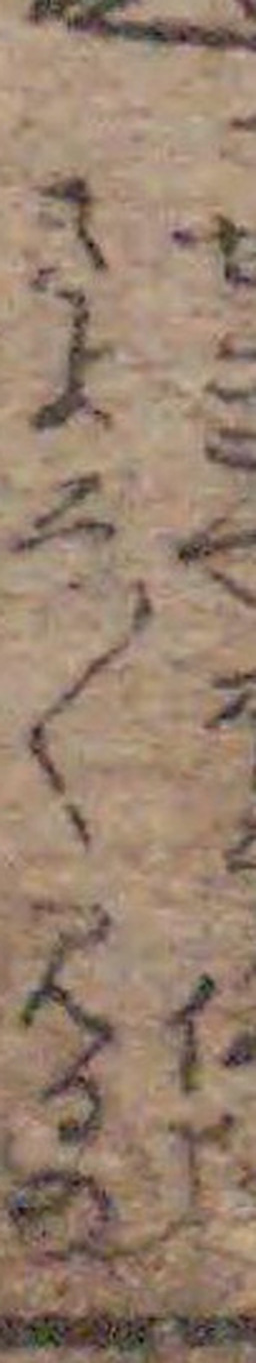きよろ〳〵見るの
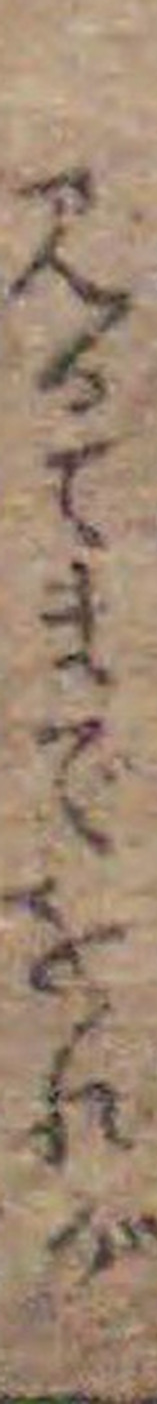見るてまでをれが
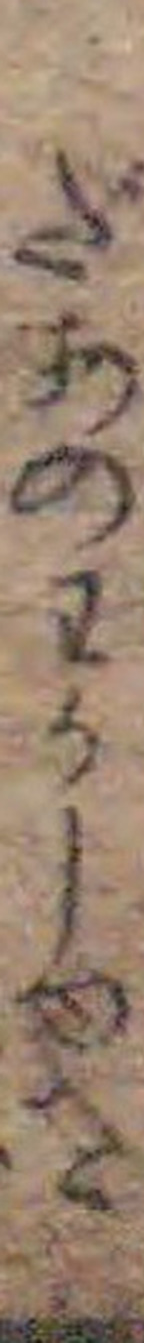だあのわかしゆを
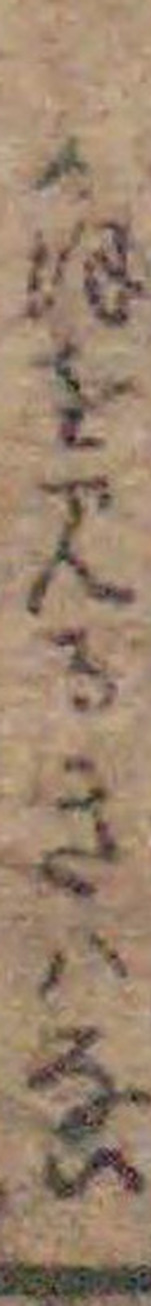かほを見るきはない

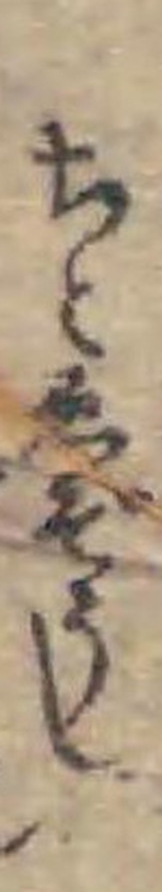ちとゑぞうし
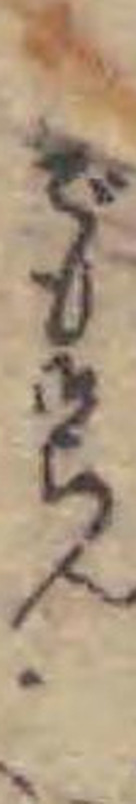でも御らん
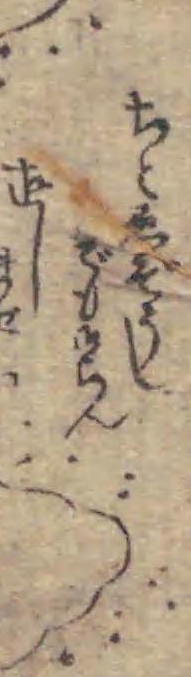ちとゑぞうし
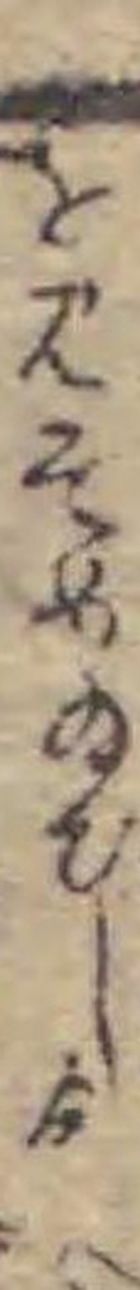を見そめ給ひし
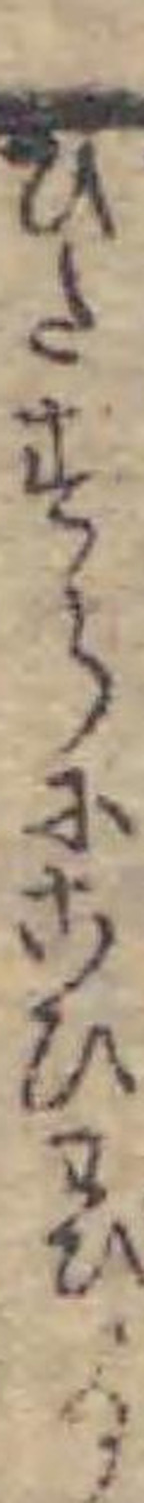ひたすらにこひわび給ひ
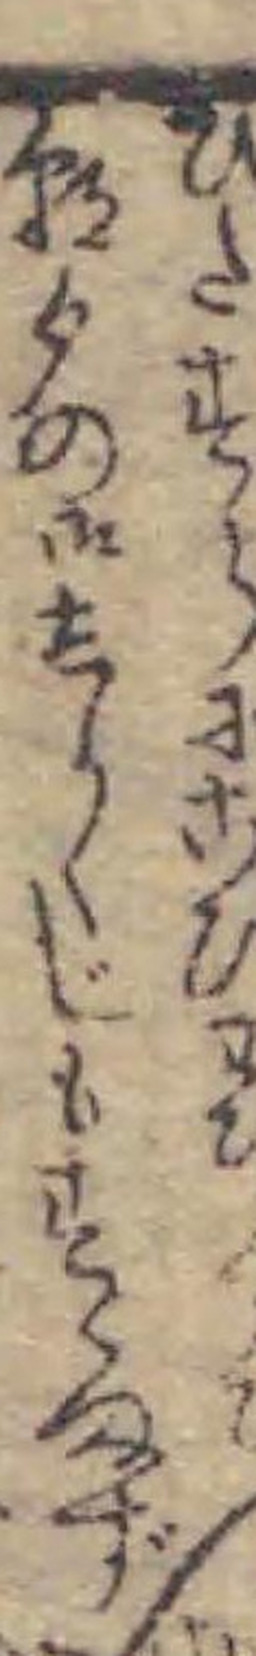朝夕の御しよくじもすゝまず
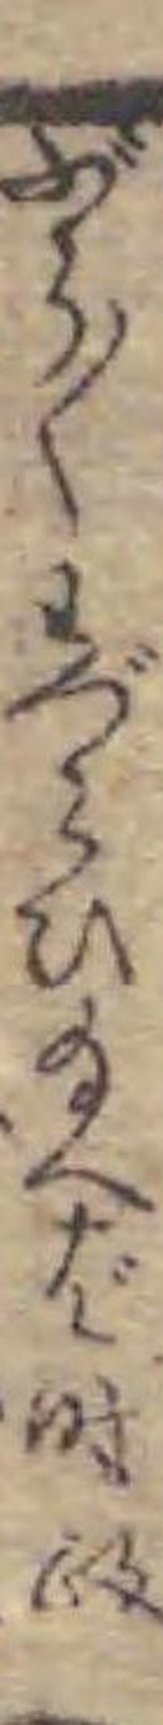ぶら〴〵わづらひ給へば時政
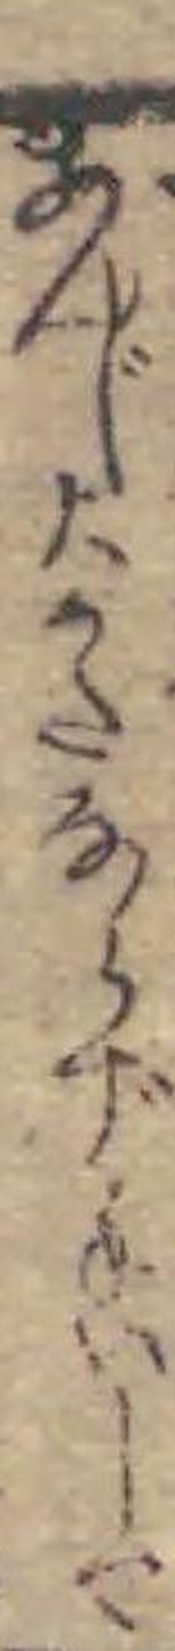あんじ大かたならず手いしや
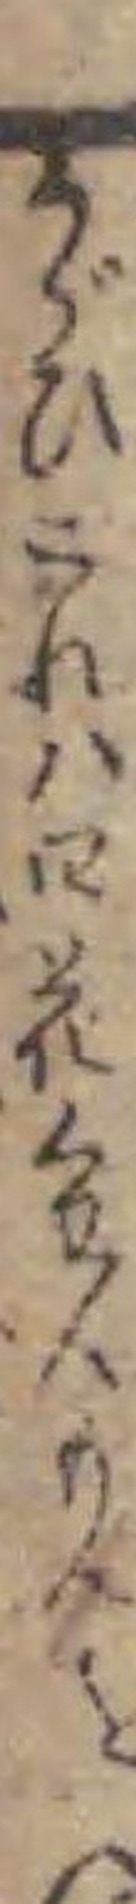かゞひこれは四花くわんもんを
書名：三舛増鱗組 : 3巻
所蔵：国立国会図書館 National Diet Library, JAPAN
